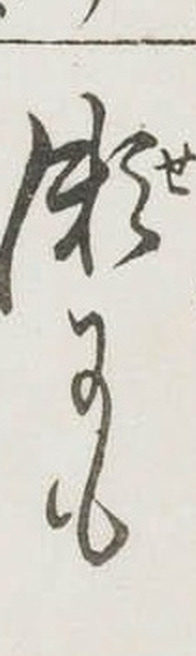瀬にも
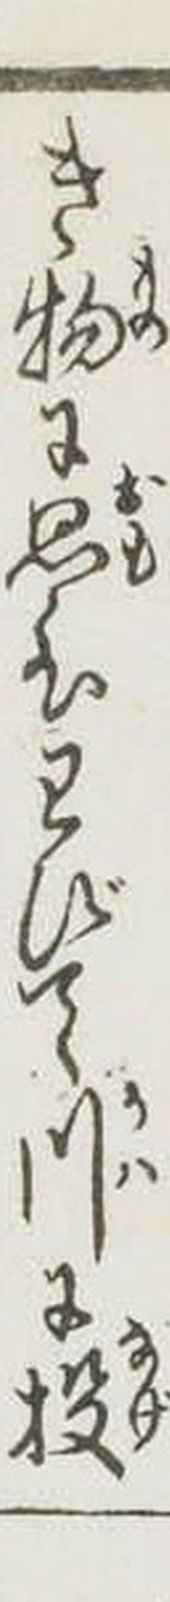き物に思ひわびて川に投
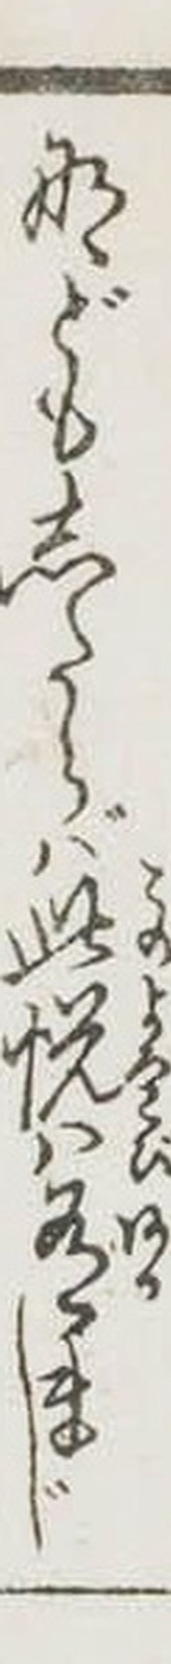などもしたらば此悦は有まじ
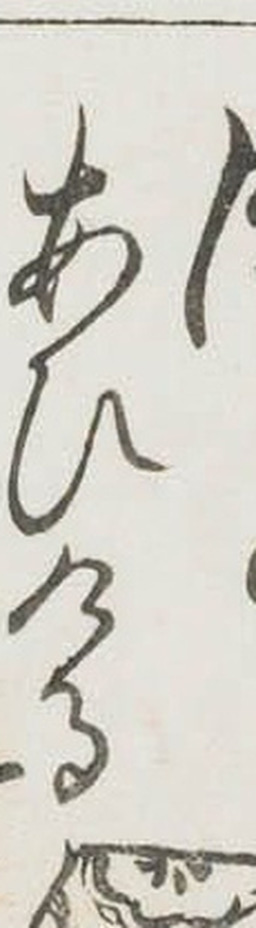あひける
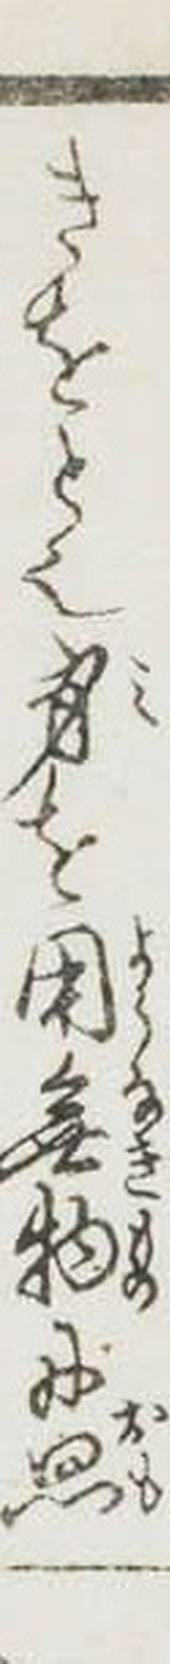きをと也身を用無物に思
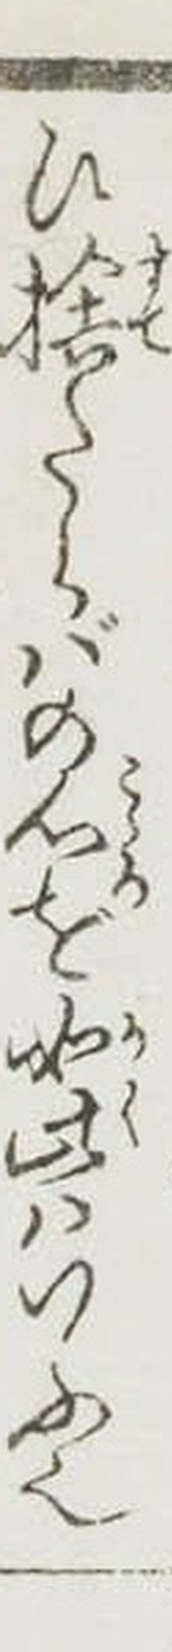ひ捨たらばの心を如此はいふ也
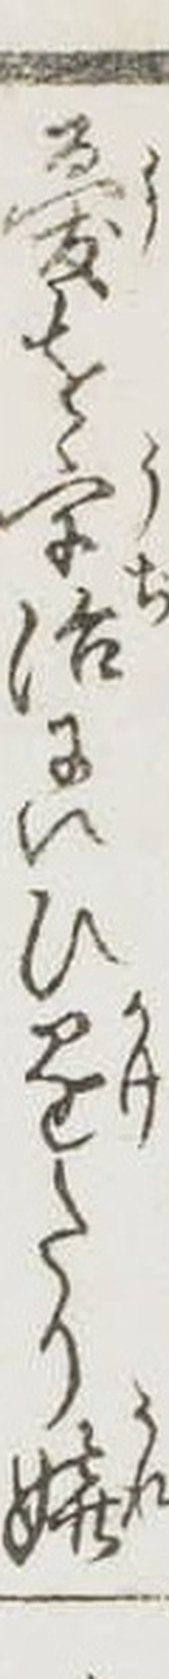憂を宇治にいひ懸たり嬉
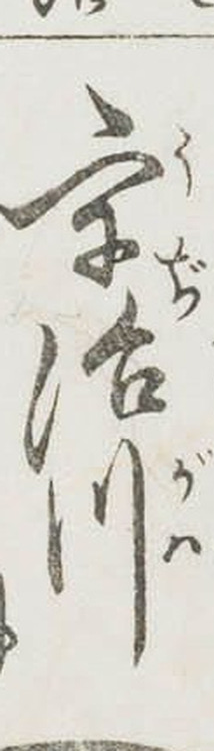宇治川
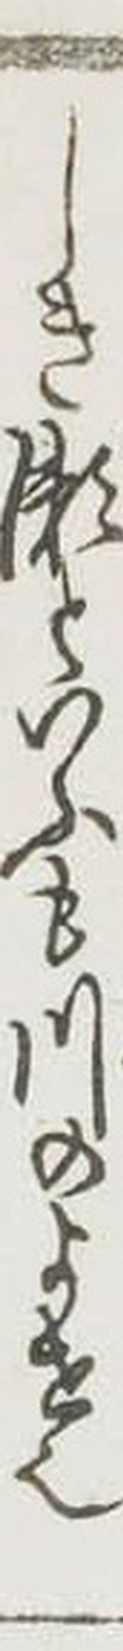しき瀬といふも川のよせ也
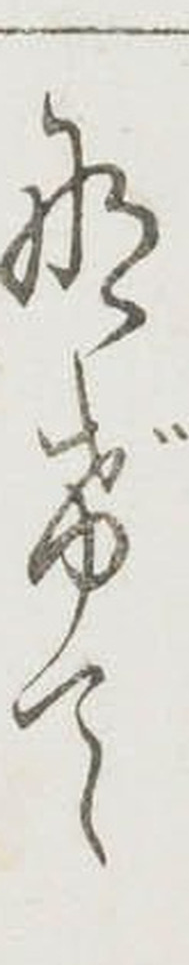なげて
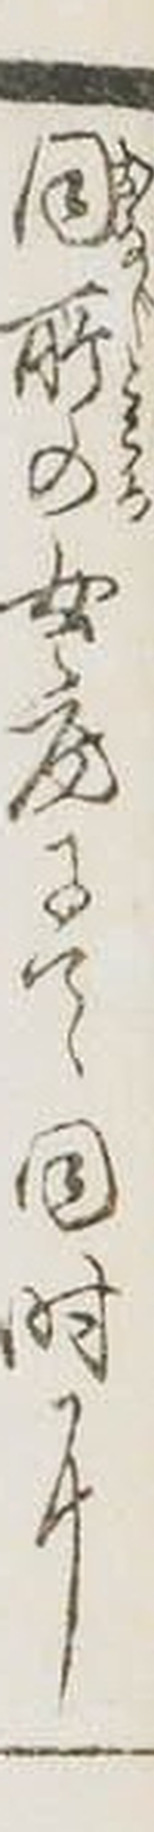同所の女房にて同時に
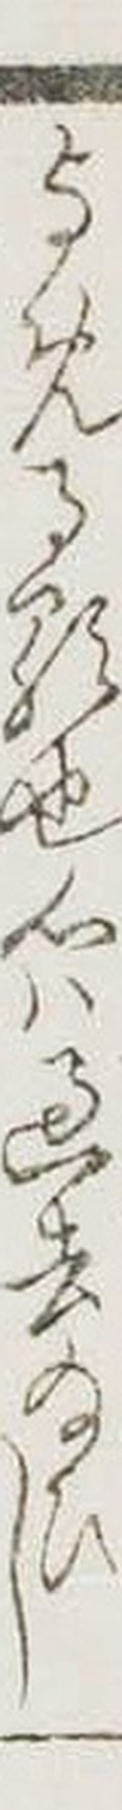よめる歌也心は過去給ひし
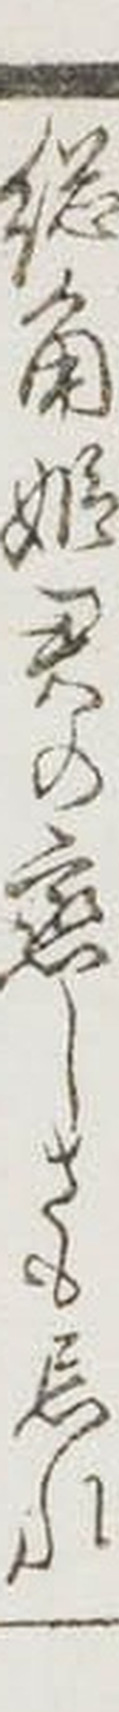総角姫君の恋しさも忘れ
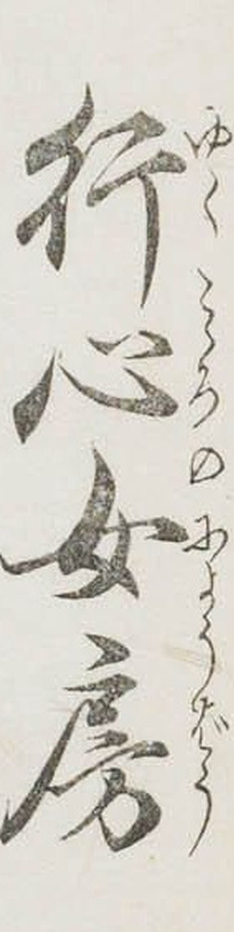行心女房
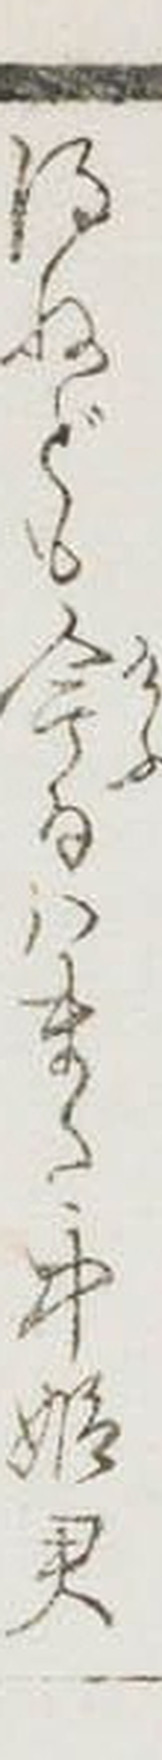得ねども今日はまた中姫君
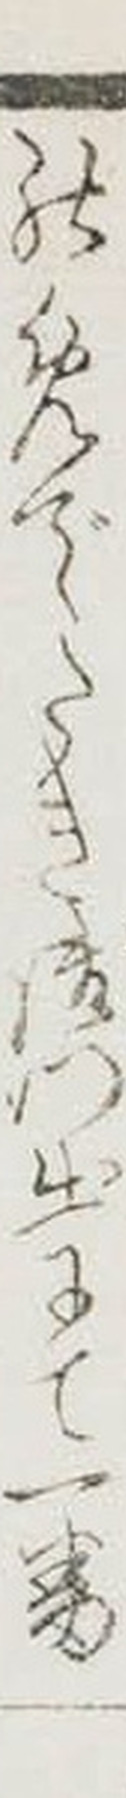のめでたき御門出にて一番
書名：源氏百人一首
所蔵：東京学芸大学教育コンテンツアーカイブ
